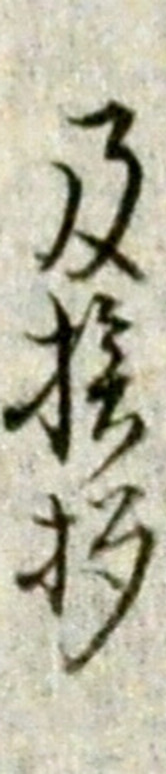及挨拶
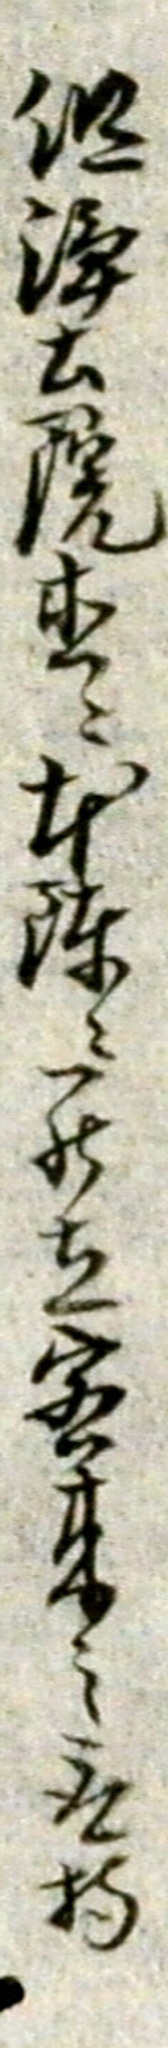但浄土院直ニ本陣ニ罷在客来之取持
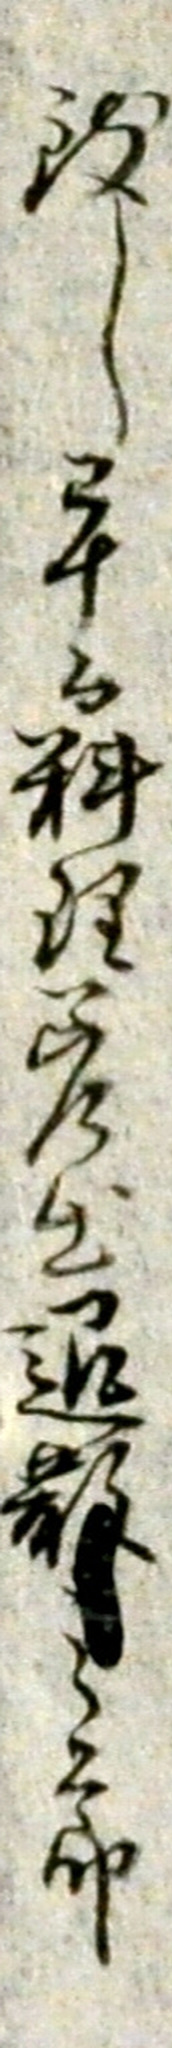致し畢而料理差出退散之節
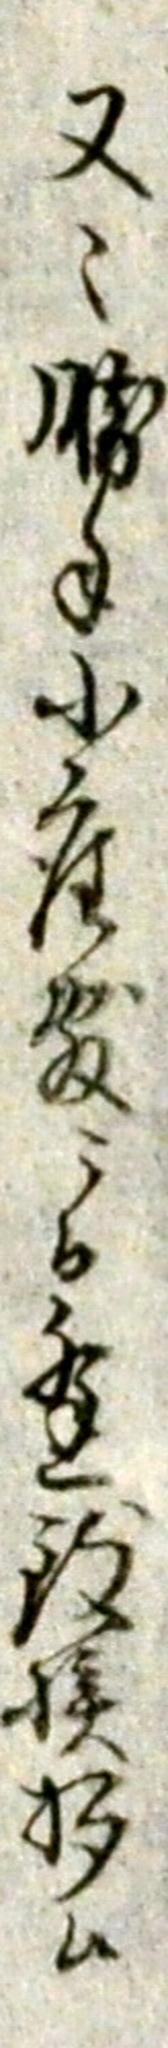又々勝手小座敷ニ而逢致挨拶候
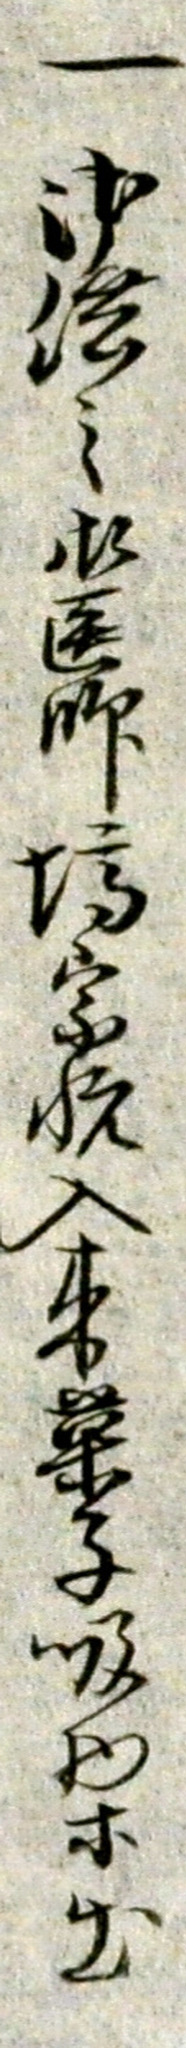一御供之御医師塙宗悦入来菓子吸物等出
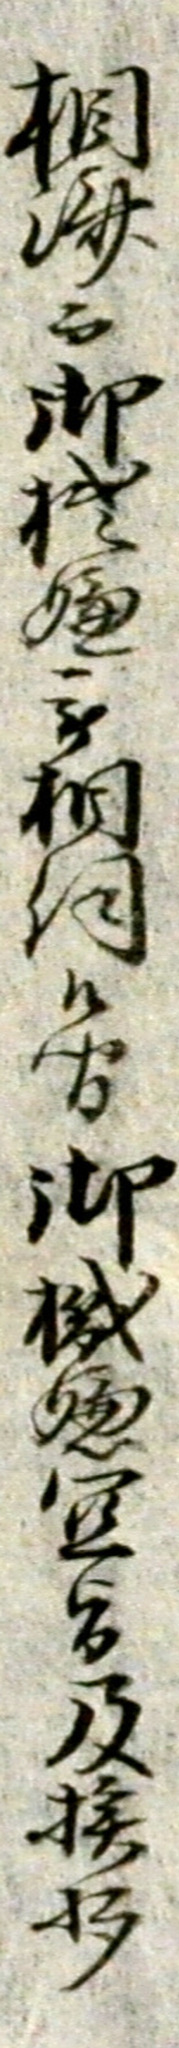相済而御機嫌被相伺候間御機嫌宜旨及挨拶
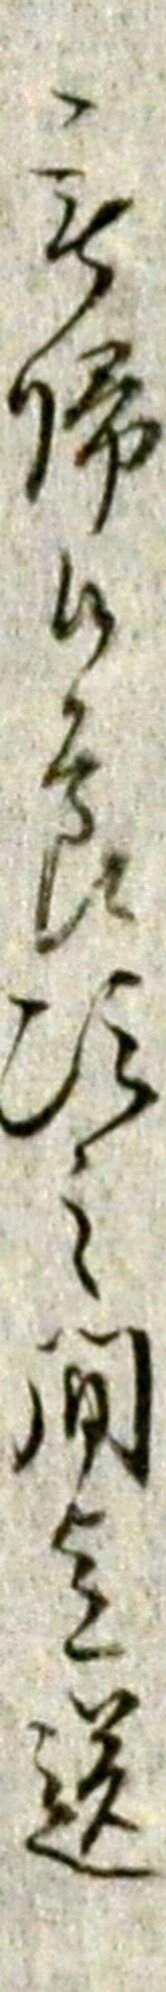被帰候節次之間迄送
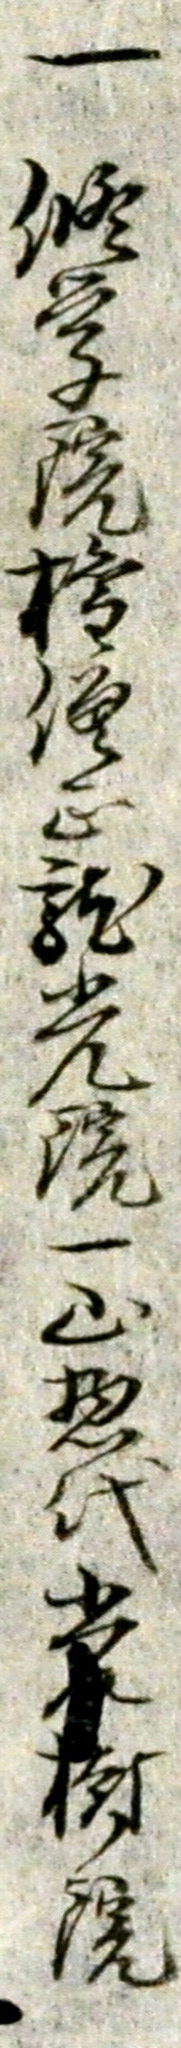一修学院権僧正龍光院一山惣代光樹院
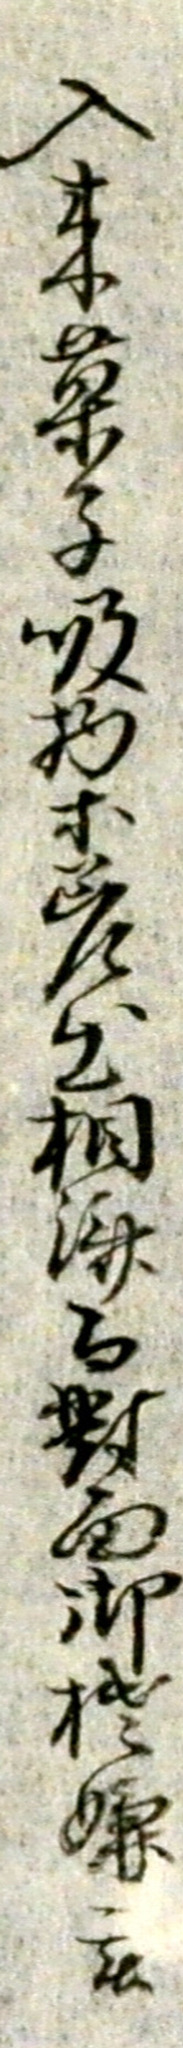入来菓子吸物等差出相済而対面御機嫌被
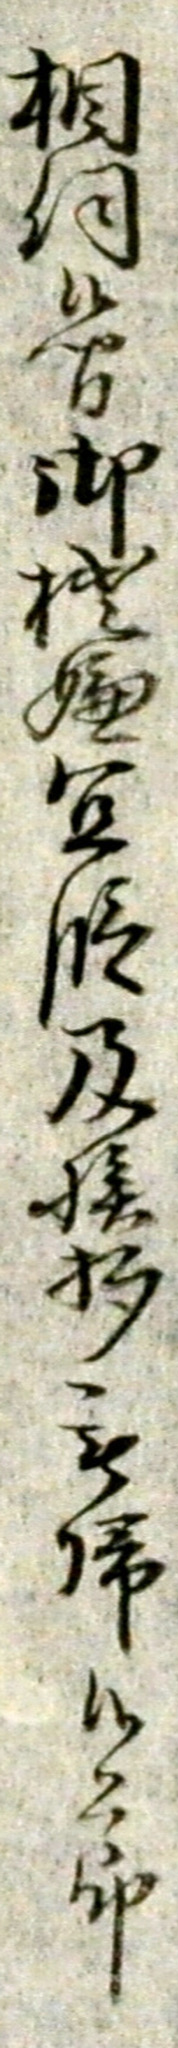相伺候間御機嫌宜段及挨拶被帰候節
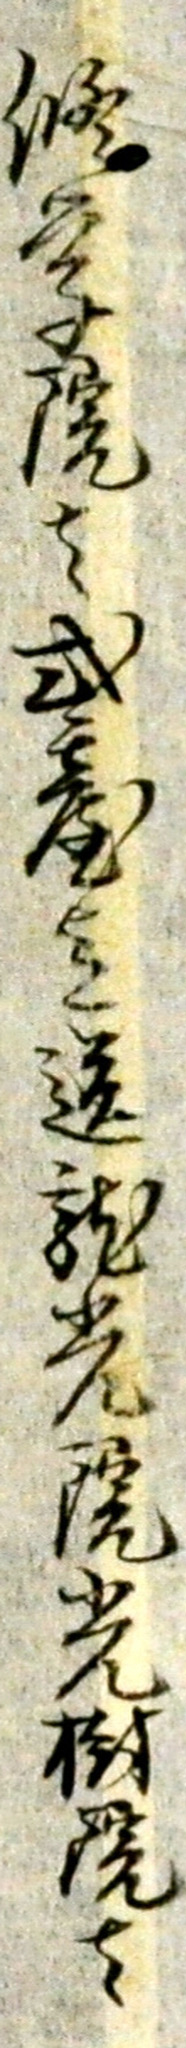修学院者式台迄送龍光院光樹院者
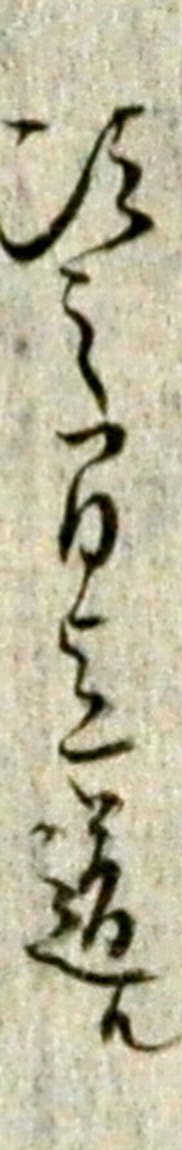次之間迄送ル
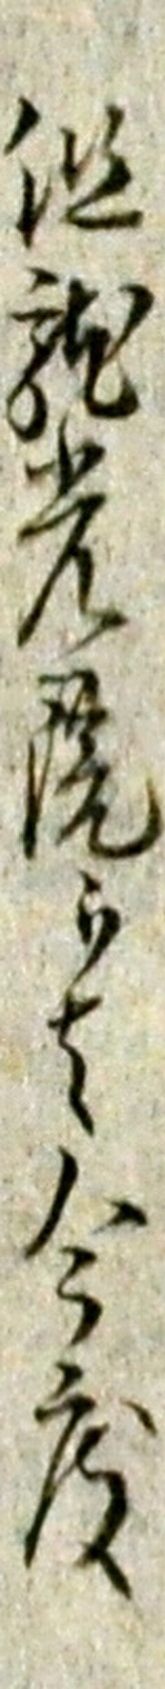但龍光院江者今度
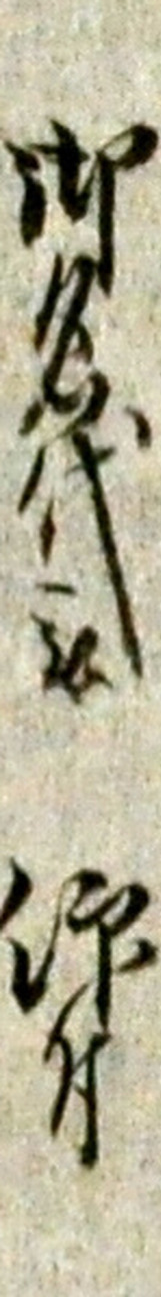御名代被仰付
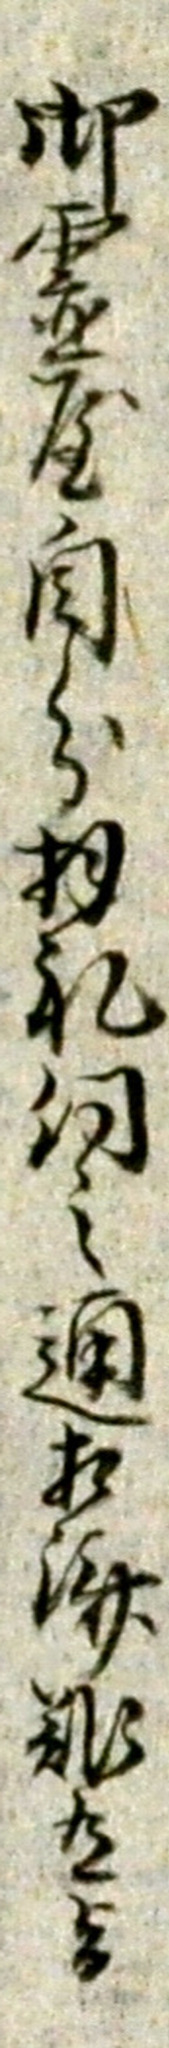御霊屋自分拝礼伺之通相済難有旨
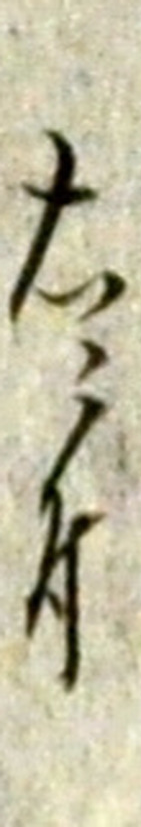右ニ付
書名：日光御名代相勤候節ノ留
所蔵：伊那市立高遠町図書館・合同会社AMANE
